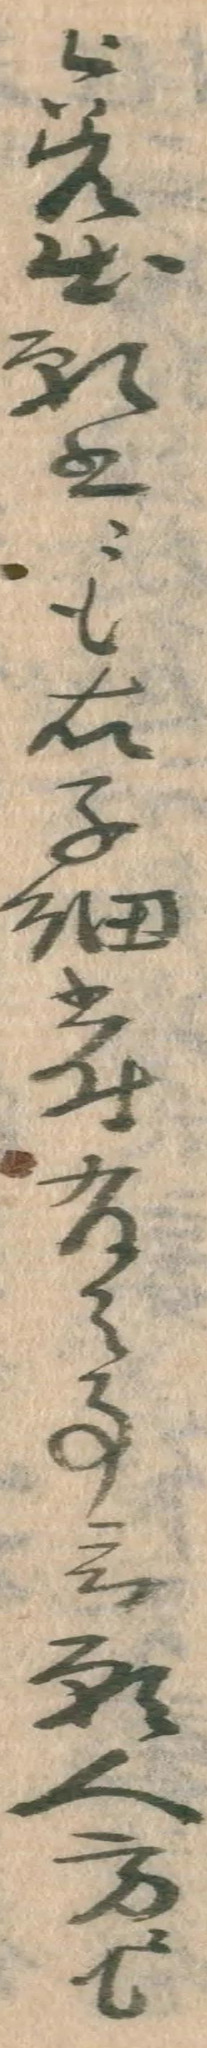被差出願書ニも右子細書付有之事ニ而、願人方ニも
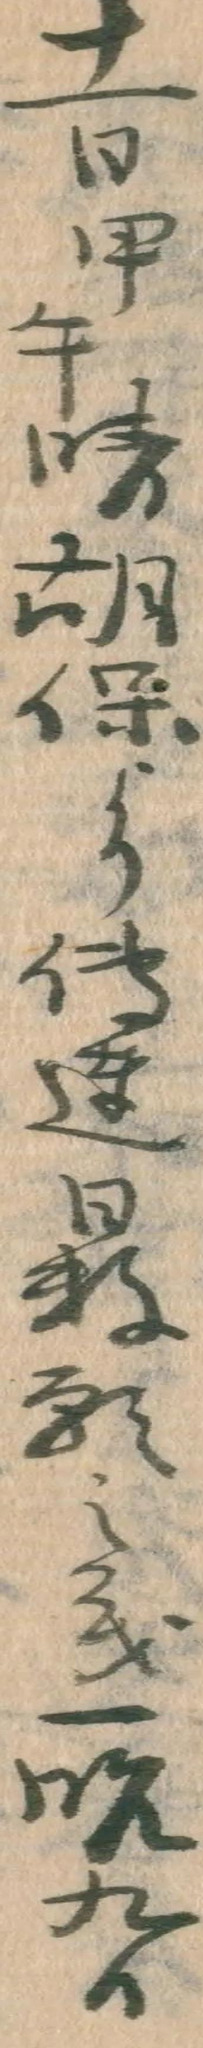十一日甲午晴、胡保より傳達、日数願之義、一昨九日
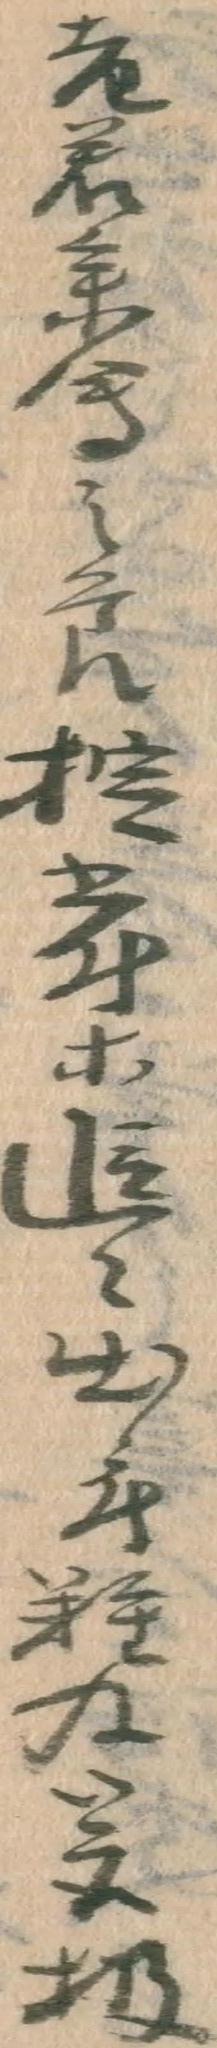老若参會之節、掟書付等追〻出候ニ付、難及御取扱
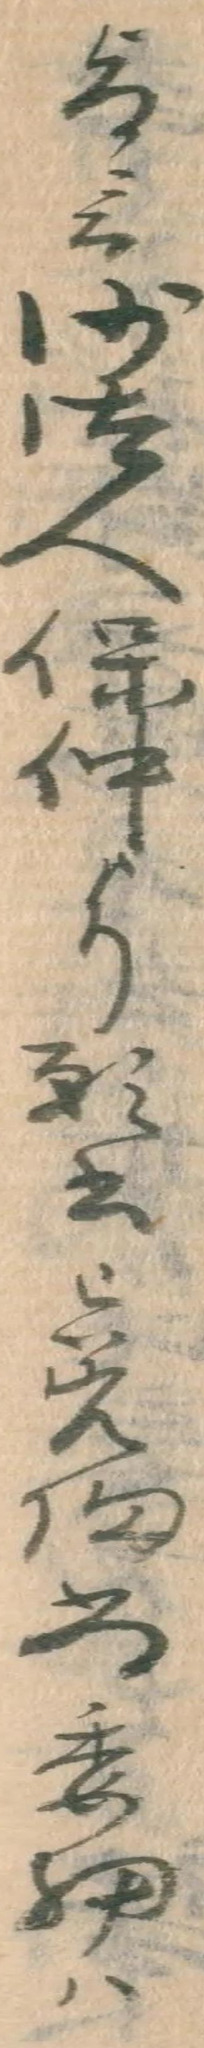旨ニ而、沙汰人保仲より願書被差帰、尚委細ハ
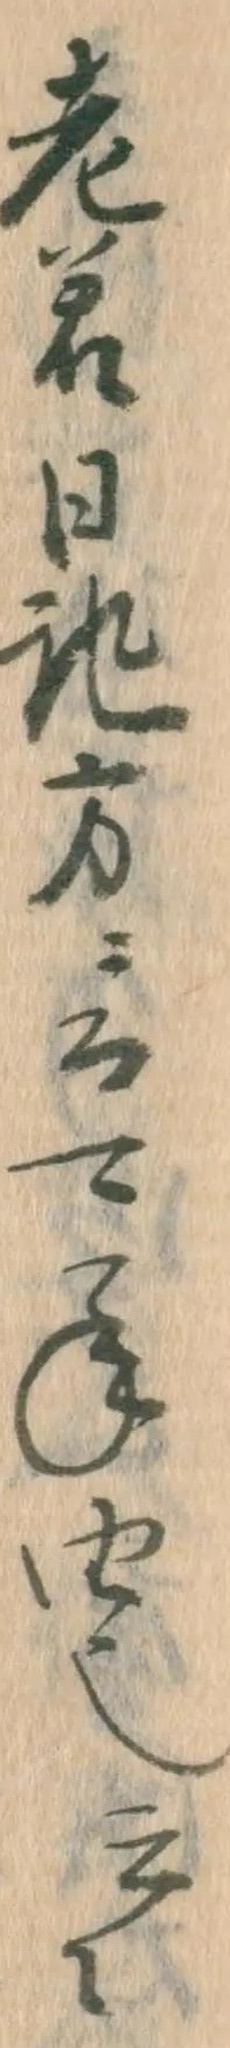老若日記方ニ而可承由也云々、
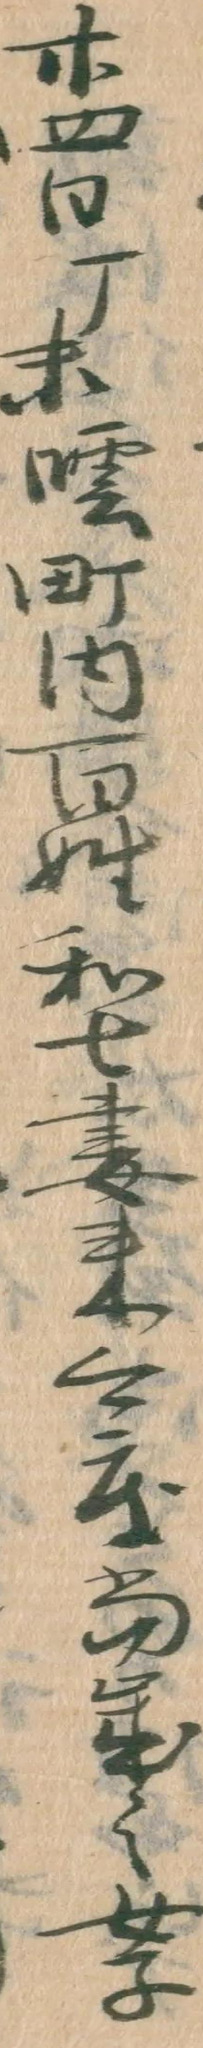廿四日丁未雲、町内百姓和七妻来、今度当歳之女子
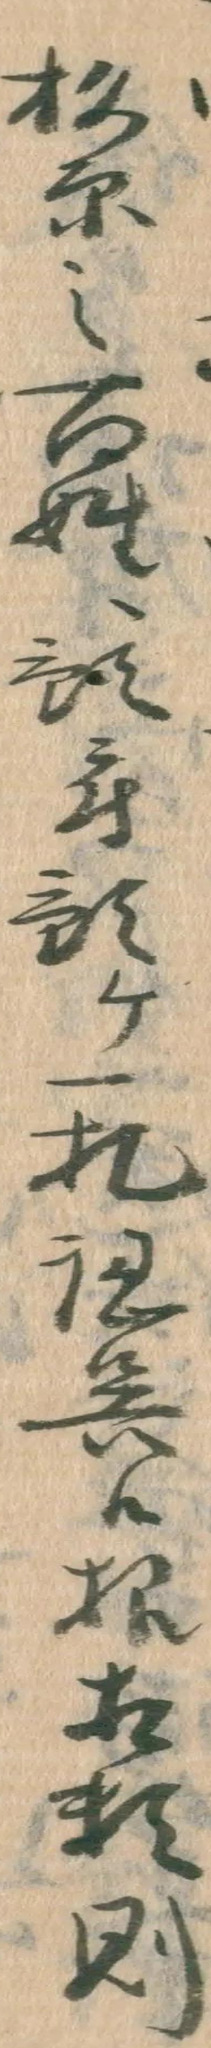杉原之百姓へ預ニ付、預ケ一札認呉候様相頼、則
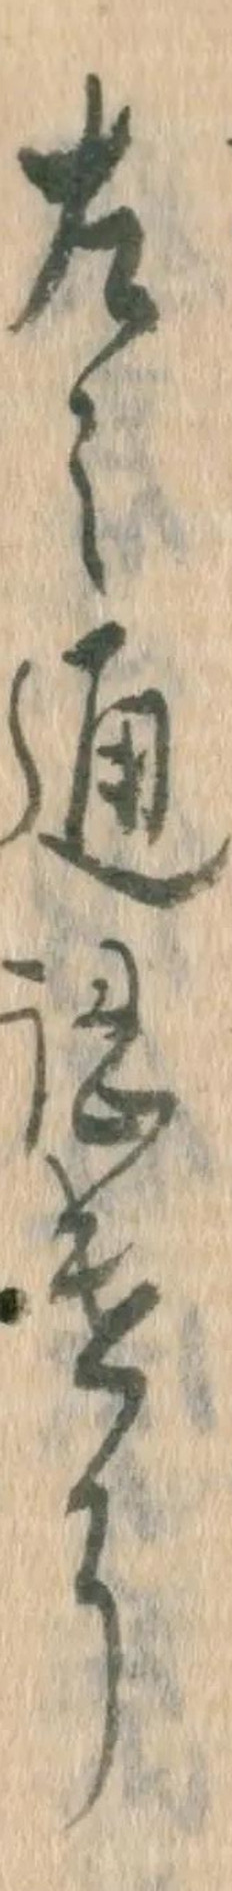左之通認遣了、
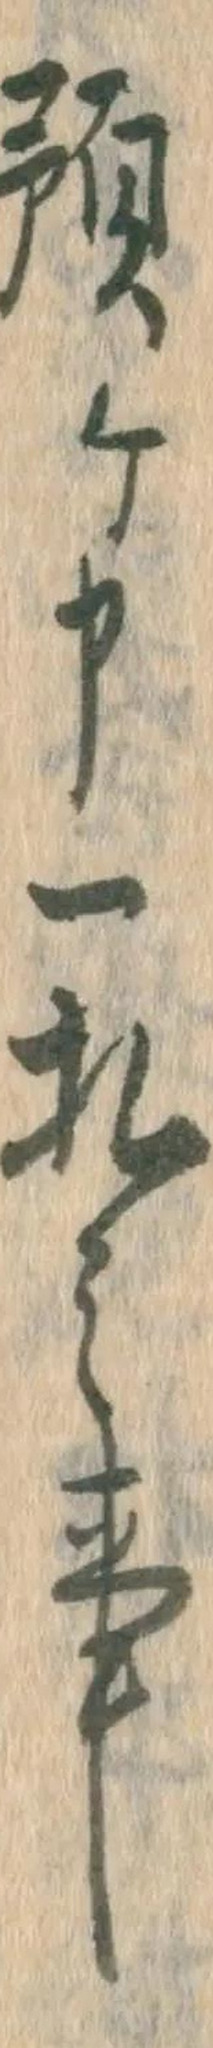預ケ申一札之事
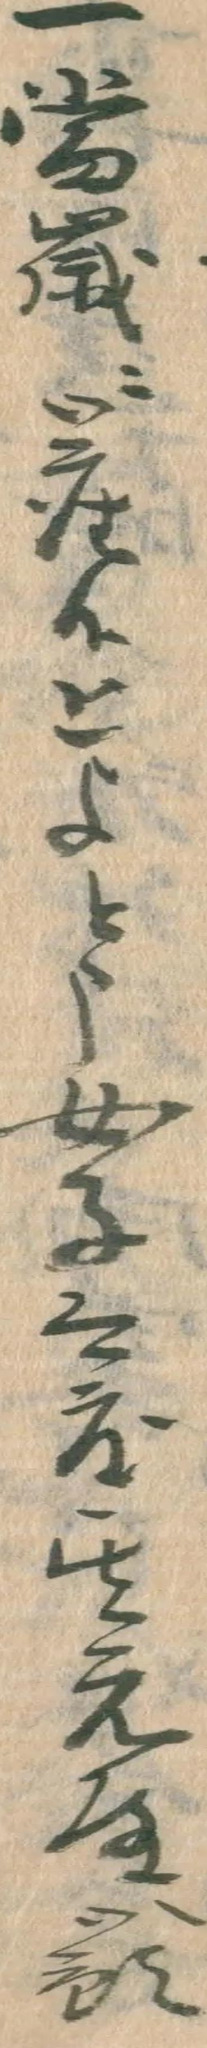一、当歳ニ御座候とよと申女子、今度其元殿へ御預
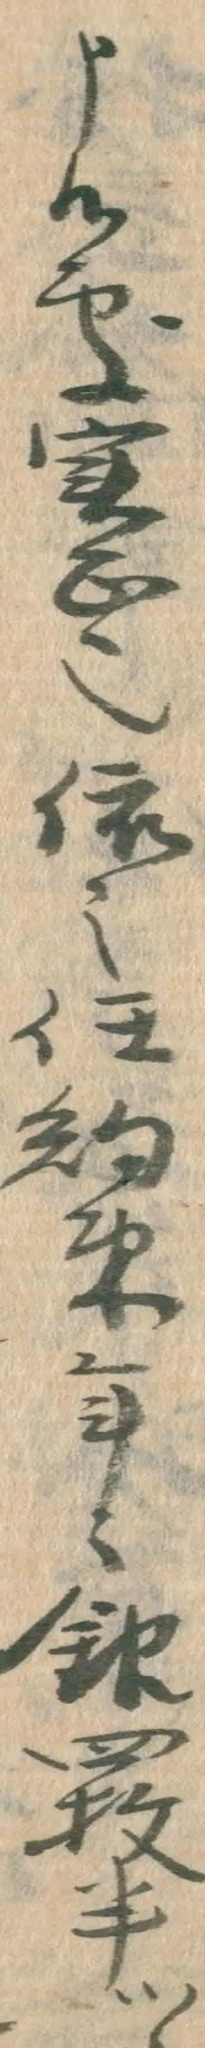申候處、実正也、依之任約束年々銀四枚半ツヽ
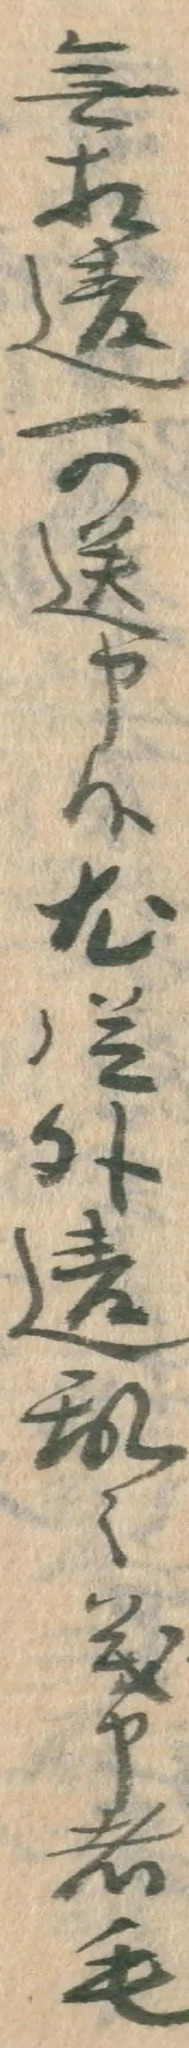無相違可送申候、尤従外違乱之義申者毛
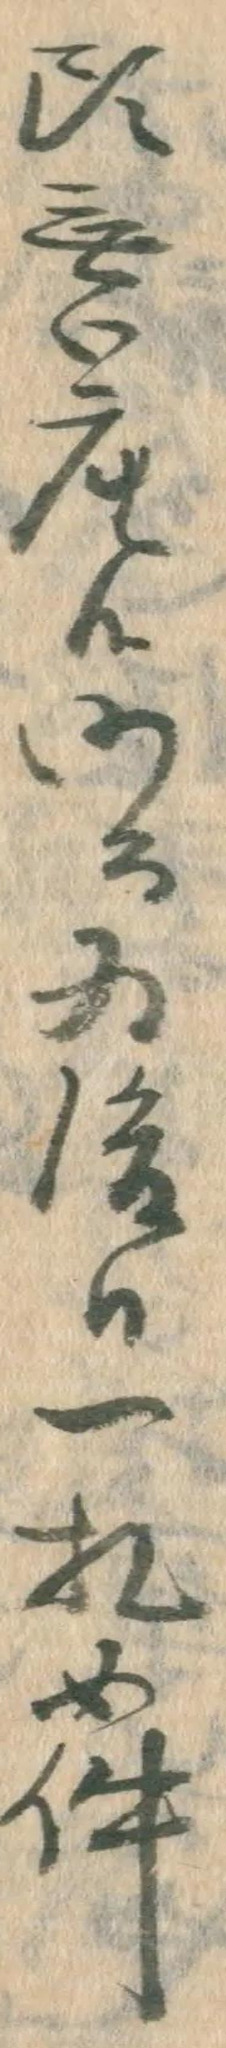頭無御座候、仍而為後候一札如件、
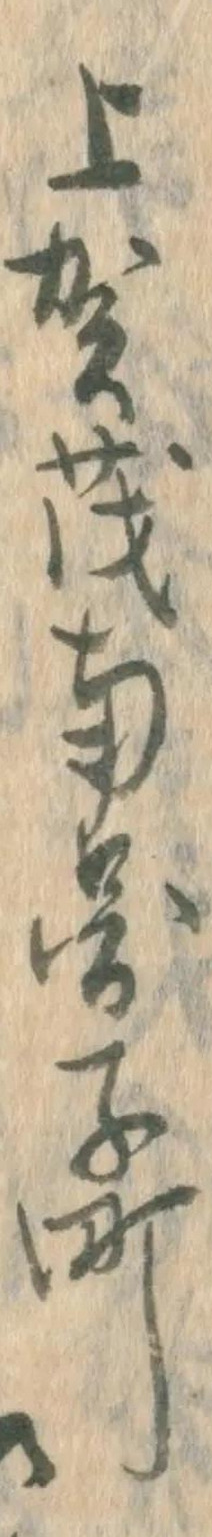上賀茂南図子町
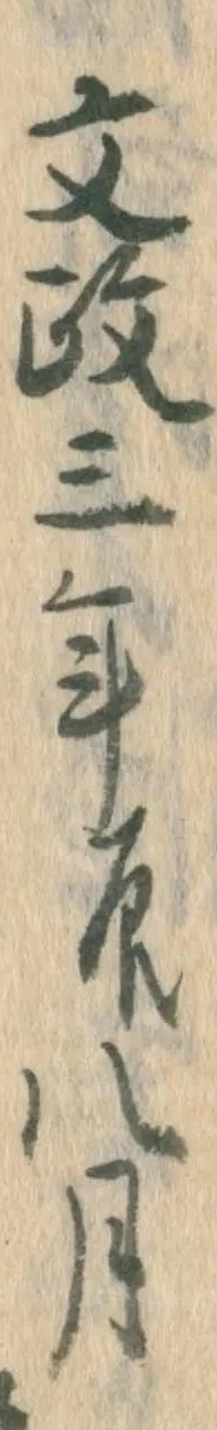文政三年辰八月
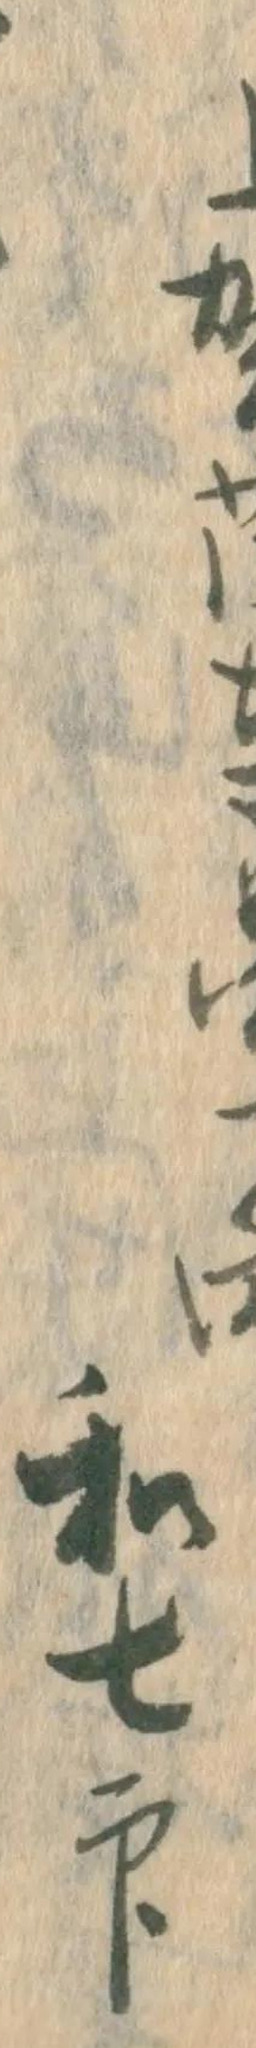和七印
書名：賀茂社記録. 第63冊
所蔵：国立国会図書館 National Diet Library, JAPAN
